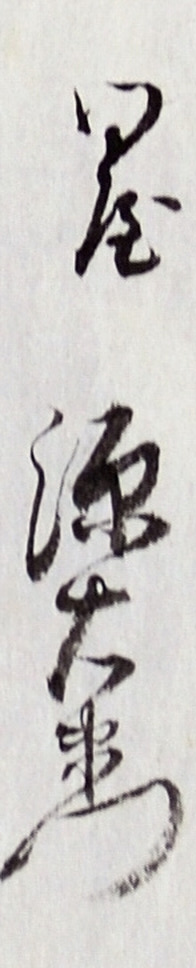同屋源右衛門
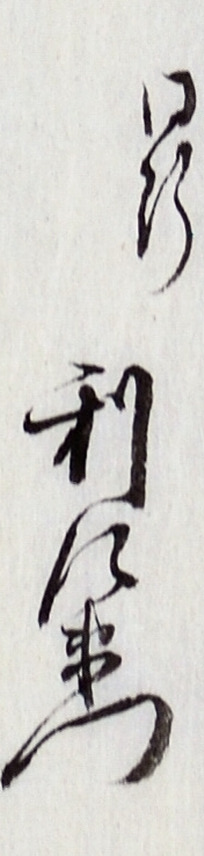同断利左衛門
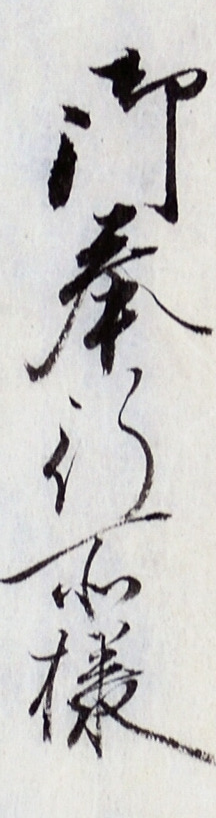御奉行所様
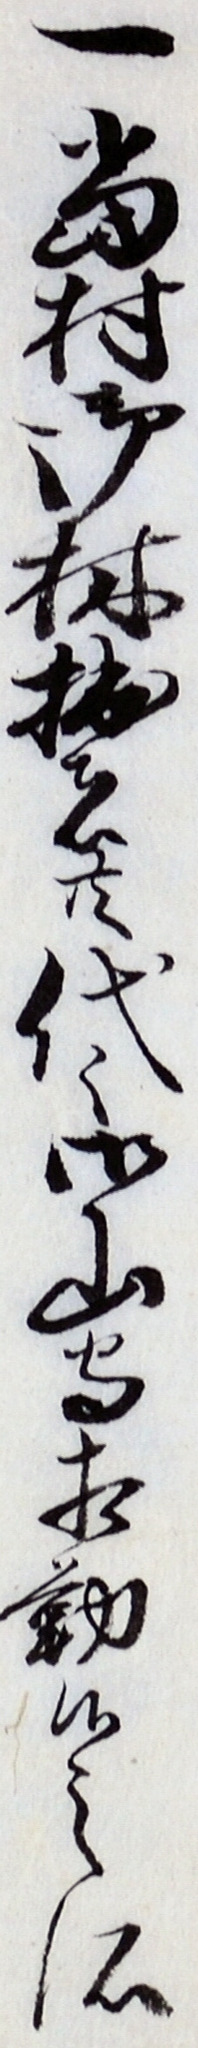一当村御林拙者共代々御山守相勤候之所
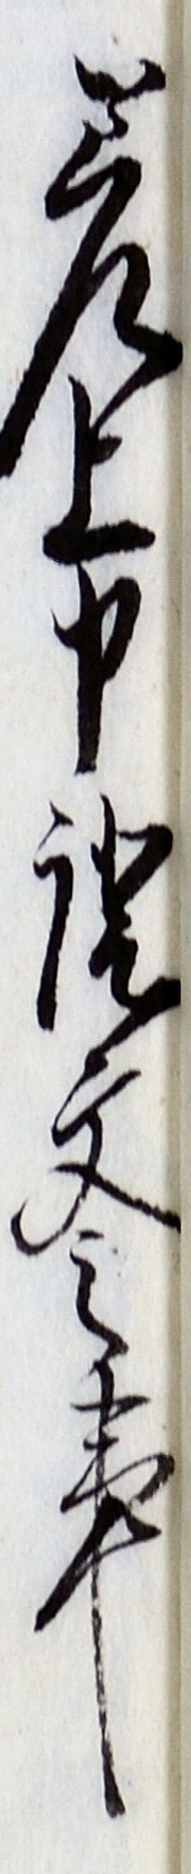差上申証文之事
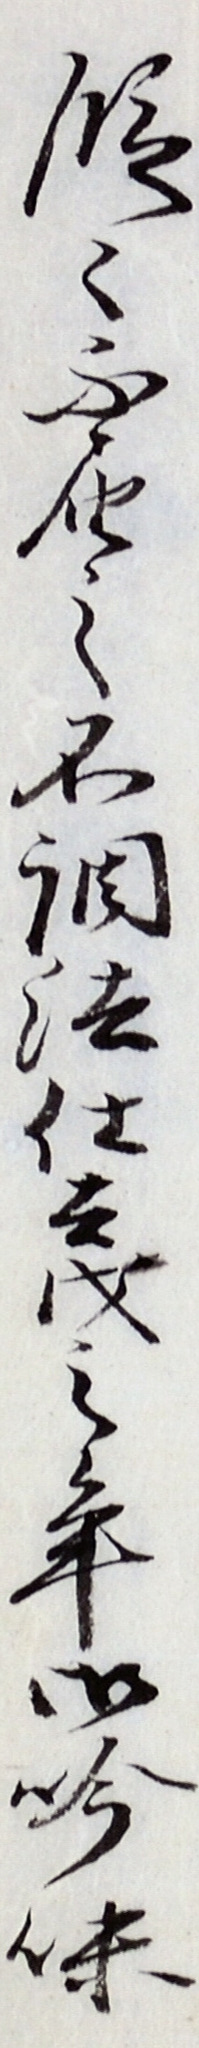段々不届之不調法仕去戊ノ年御吟味
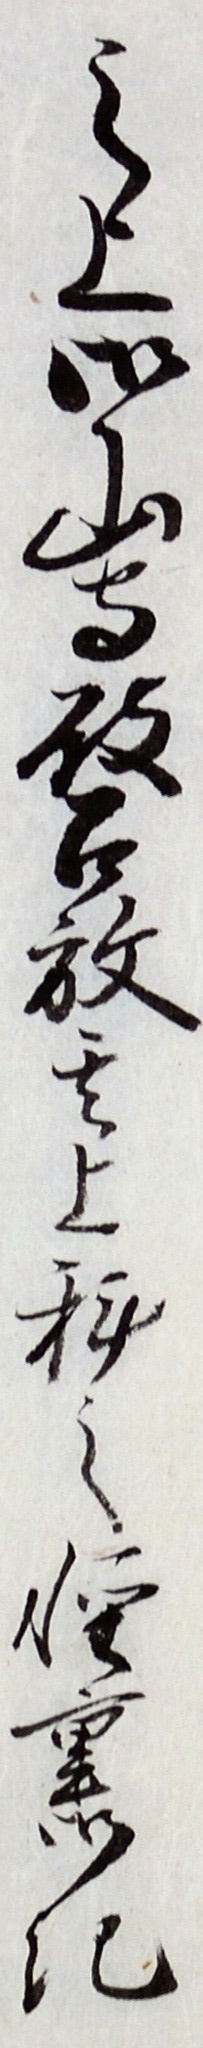之上御山守被召放其上科之軽重御糺
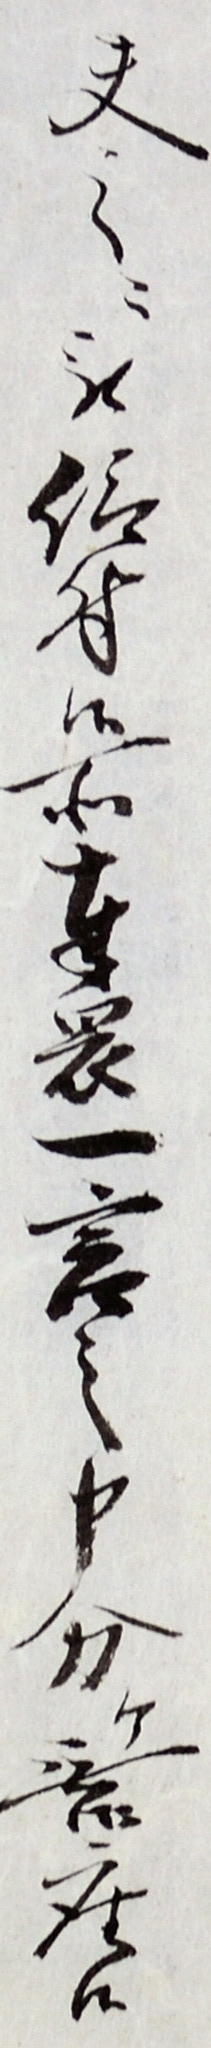夫之ニ被仰付候所奉畏一言之申分ヶ無御座候
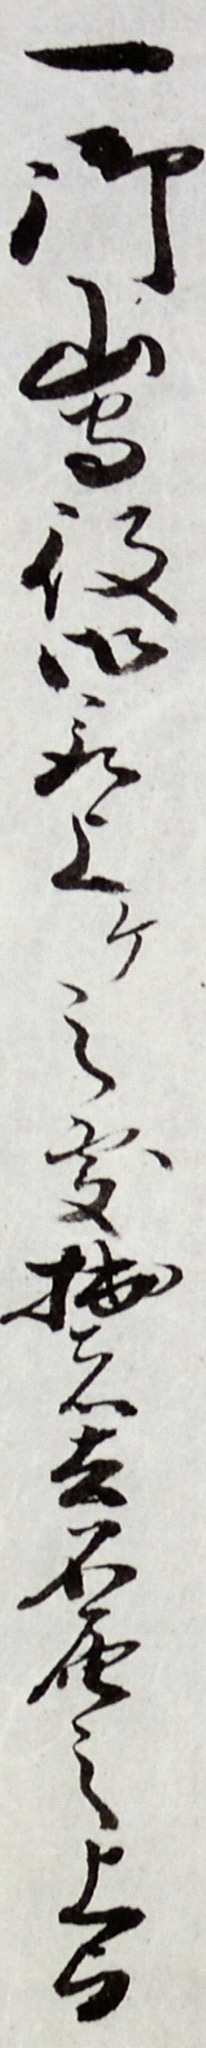一御山守役御取上ヶ之処拙者者不届之上与
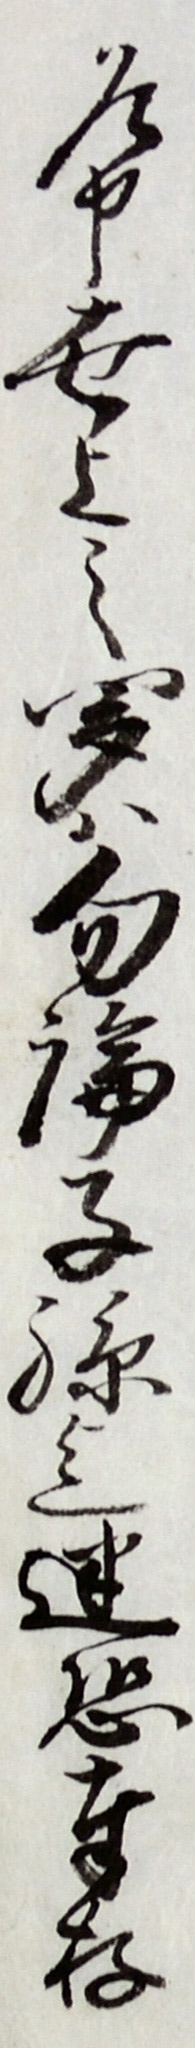乍申世上之聞ハ勿論子孫迄迷惑奉存

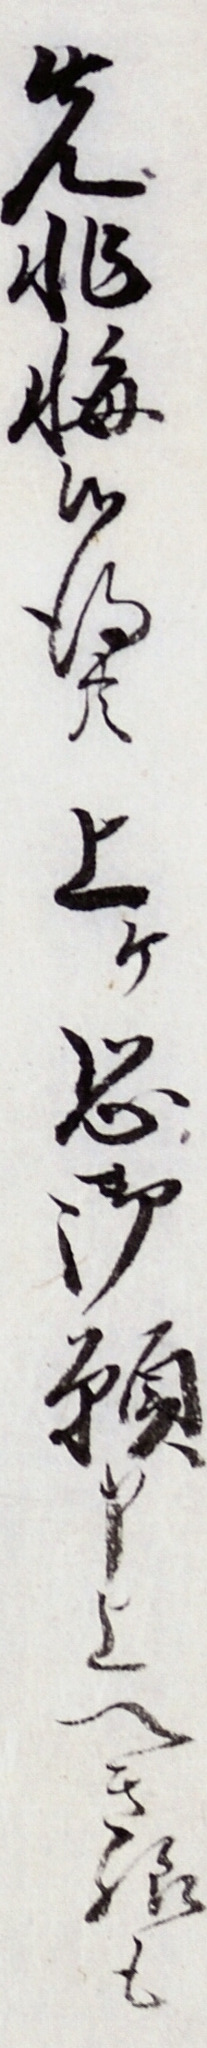先非悔候得共上ヶ恐御願申上へき様も
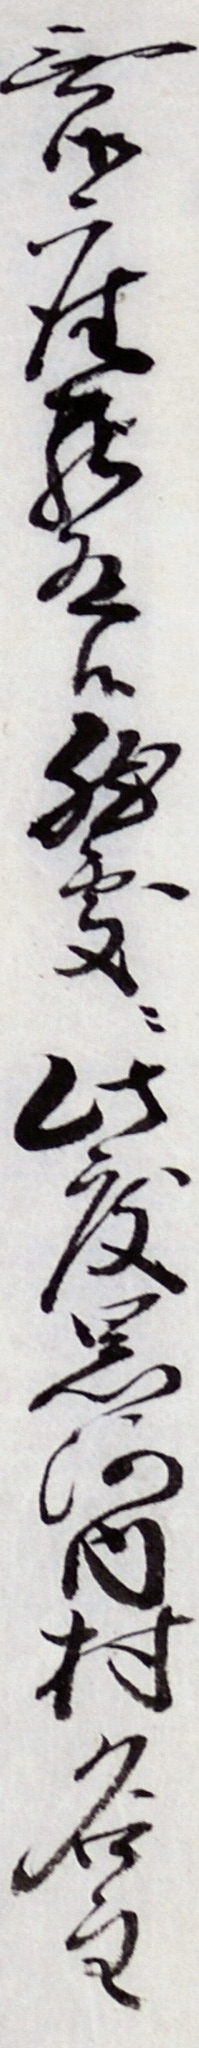無御座罷有候然処ニ此度黒河内村名主
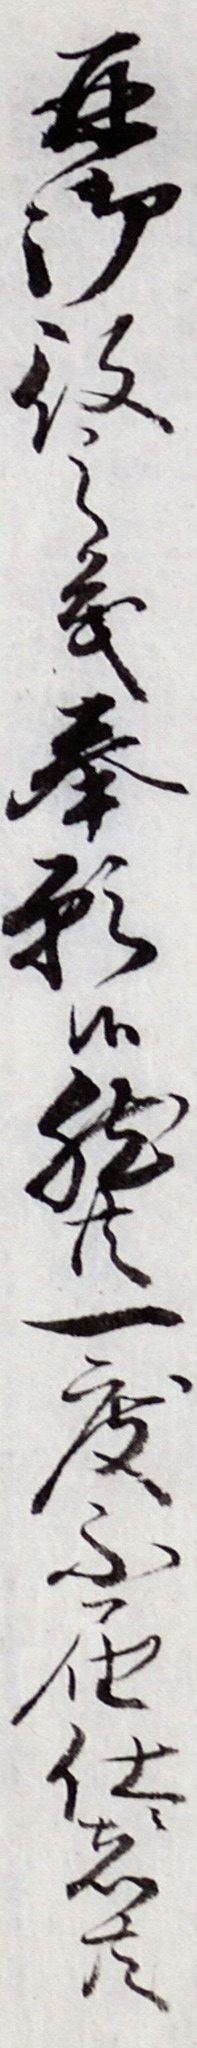再御役之義奉願候然共一度不届仕者共
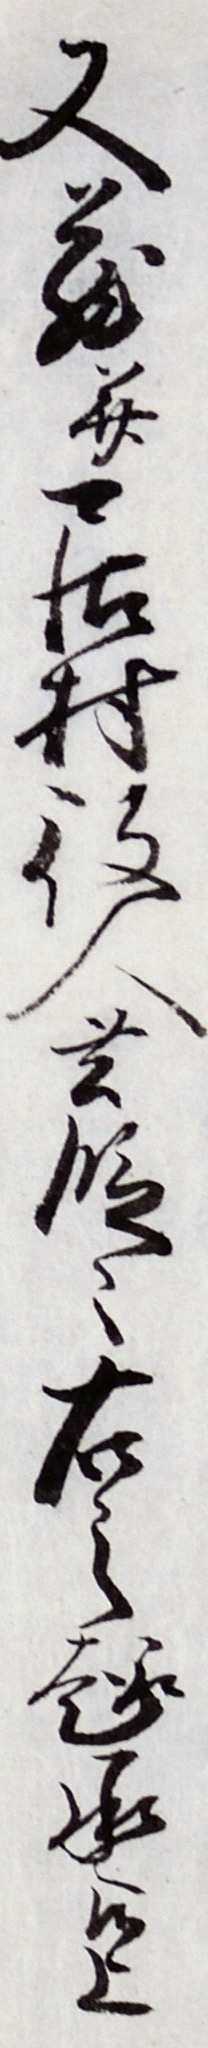又蔵并居村役人共段々右之趣承候上
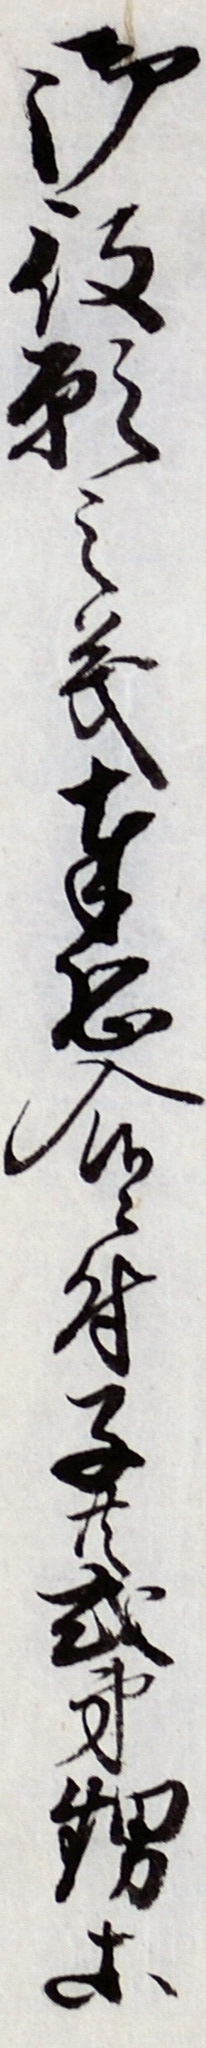御役願之義奉恐入候ニ付子共弐第甥等
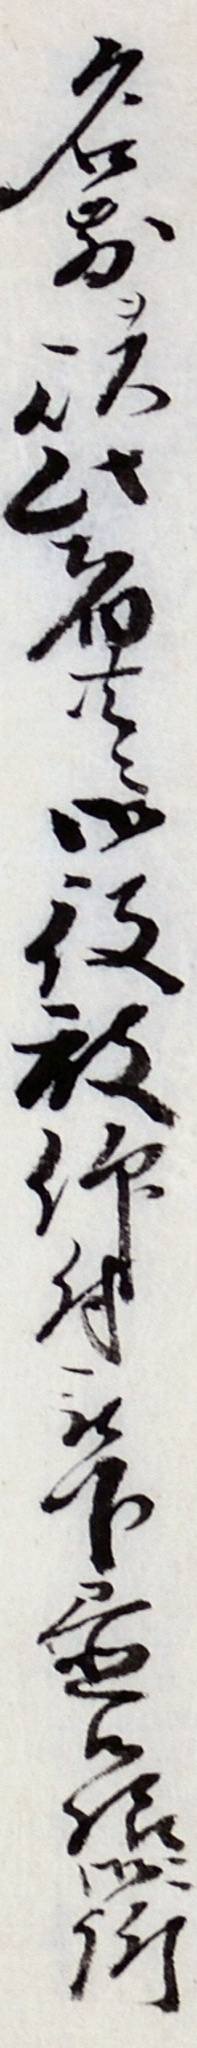名前ヲ以此者共ニ御役被仰付被下置候様ニ御訴
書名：御林御竹藪証文控
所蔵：伊那市立高遠町図書館・合同会社AMANE
